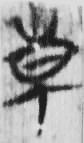東
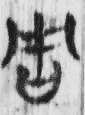周
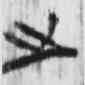之
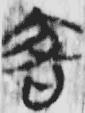客
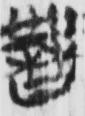○（許）
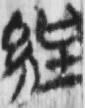○（盈）
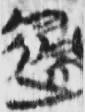歸
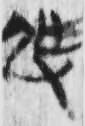{尸拃}（胙）
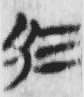於
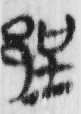郢
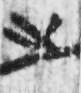之
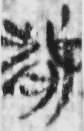歲（歲）
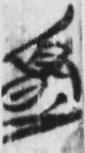○（夏）
